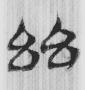𢆶
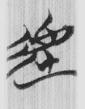𫊟
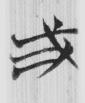弍
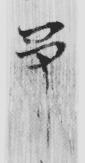邑
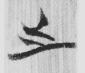之
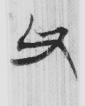父
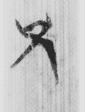兄
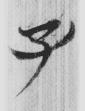子
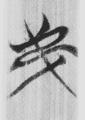弟
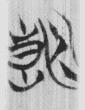朝
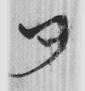夕
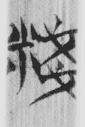{米戔}
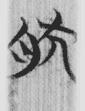肰
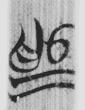爲
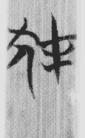犲
